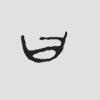曰
